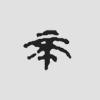不
